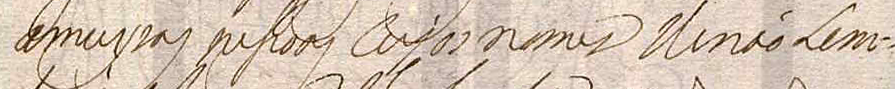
a muytas pessoas cujos nomes lhe naõ Lem
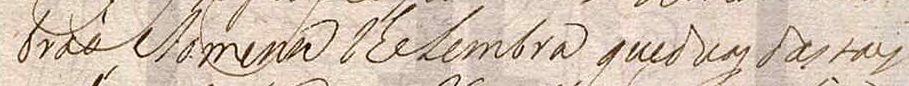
braõ somente lhe Lembra que duas das taes
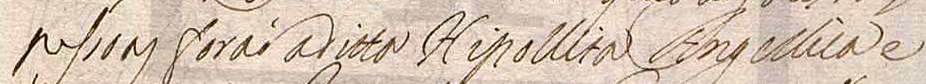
pessoas foraõ a ditta Hipollita Angellica e
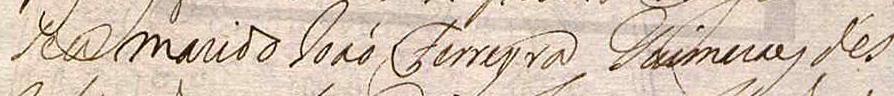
seu marido Ioaõ Ferreyra Guimaraes des
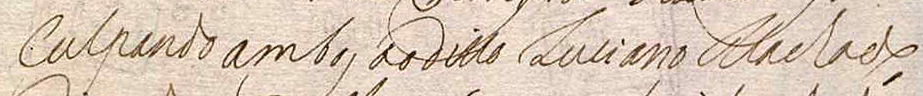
Culpando ambos ao ditto Luciano Machado,
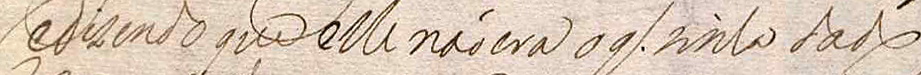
e dizendo que elle naõ era o q̄ tinha dado
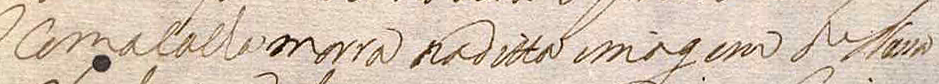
com a cachomorra na ditta imagem de Nossa
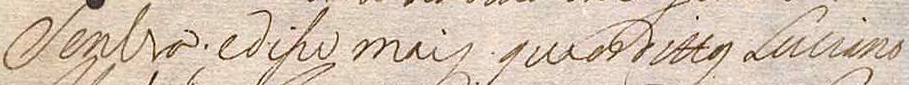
Senhora; e disse mais que os dittos Luciano
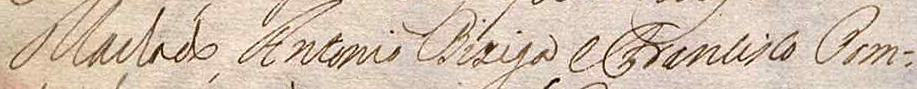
Machado, Antonio Bixiga, e Francisco Pom
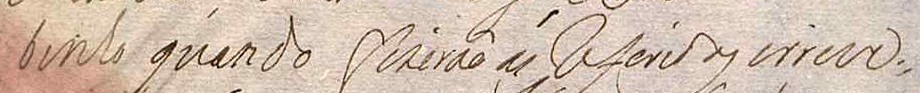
binho quando fizeraõ as Referidas irreve
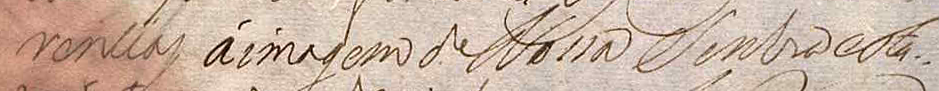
rencias á imagem de Nossa Senhora esta
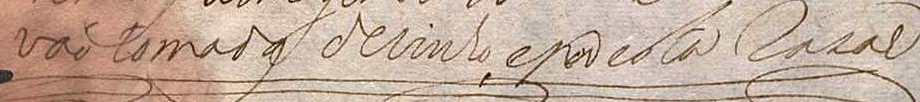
vaõ tomados de vinho, e por esta Razaõ
